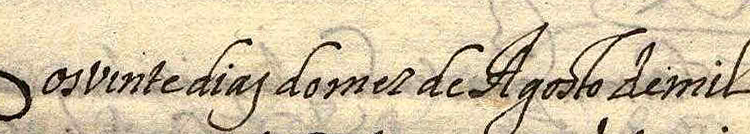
os vinte dias do mez de Agosto de mil
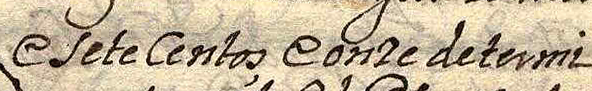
e setecentos e onze determi
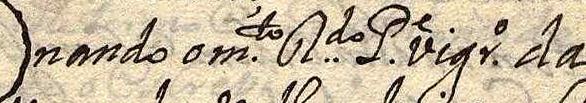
nando o m.to R.do P.e vigr.o da
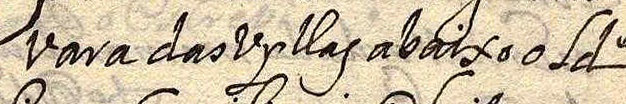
Vara das Vyllas abaixo o Ldo
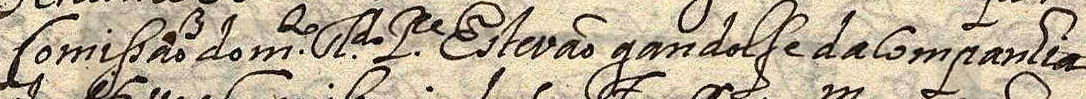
Comissaõ do m.to R.do P.e Estevão gandolfe da Companhia
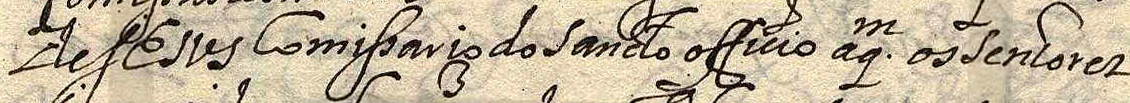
de JEsVs Comissario do Sancto officio a q.m os senhores
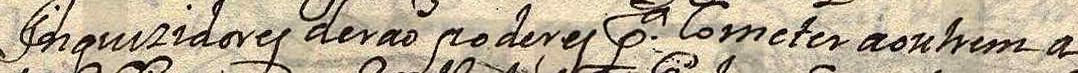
Inquizidores deraõ poderes p.a Cometer a outrem a
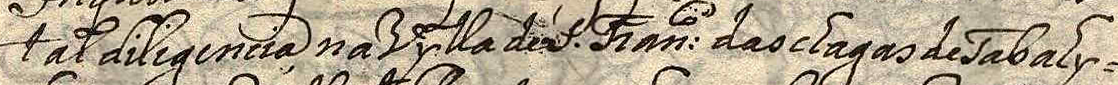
tal diligencia na Vylla de S. Fran.co das chagas de Tabahy
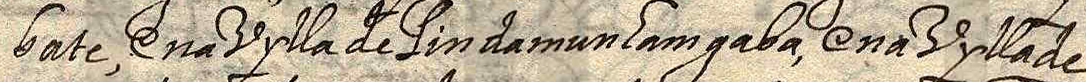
bate, e na Vylla de Pindamunhamgaba, e na Vylla de
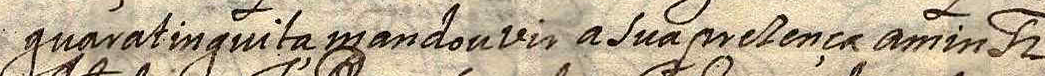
guaratinguita mandou vir a sua prezença a min Fr
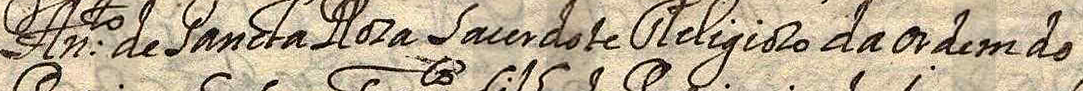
An.to de Sancta Roza Sacerdote Religiozo da ordem do
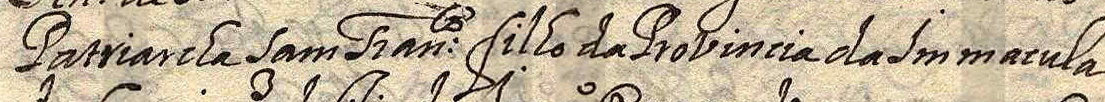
Patriarcha sam Fran.co filho da Provincia da Immacula
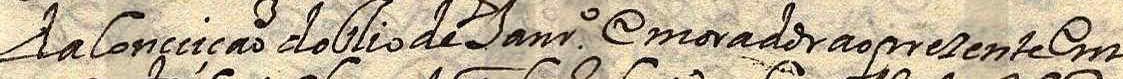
da Conceiçaõ do Rio de Ianr.o e morador ao prezente em
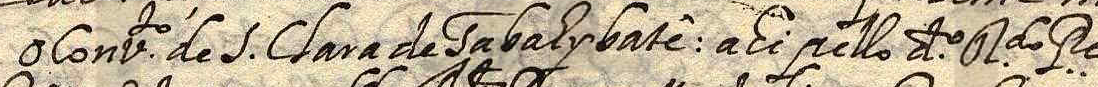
o Conv.o de S. Clara de Tabahybaté: ahi pello d̄.o R.do P.e
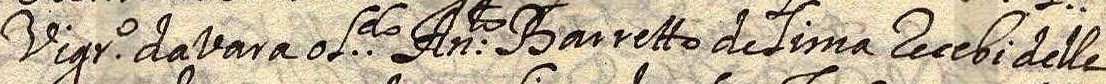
Vigr.o da vara o L.do An.to Barretto de Lima Recebi delle
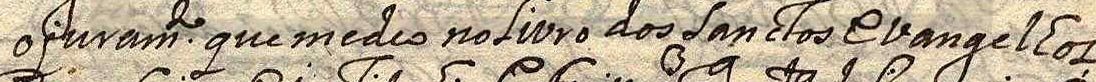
o juram.to. que me deo no Livro dos Sanctos Evangelhos
